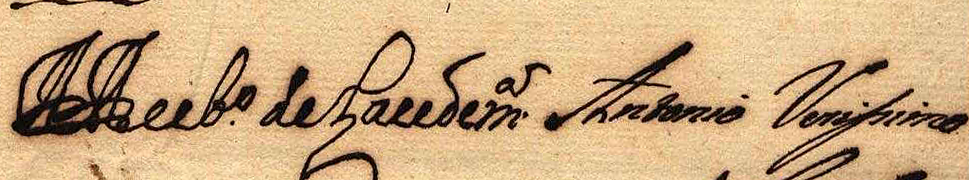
A Arceb.o de Lacedem.a Antonio Verissimo
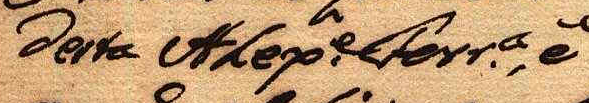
desta Alex.e Ferr.a, e
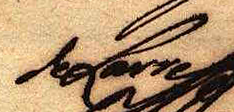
de Larre
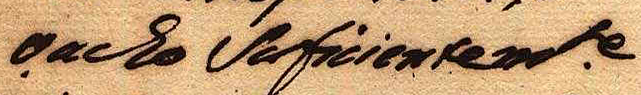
o acho suficientem.te
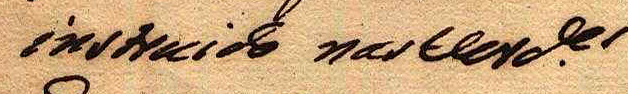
instruido nas verd.es
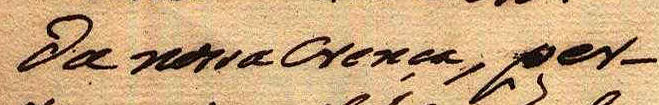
da nossa crença, per
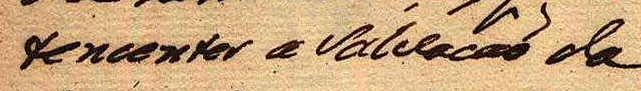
tencentes a salvaçaõ da
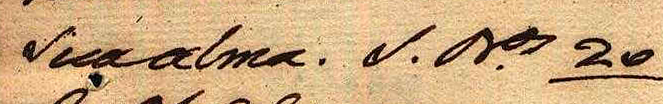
sua alma. S. N.os 20
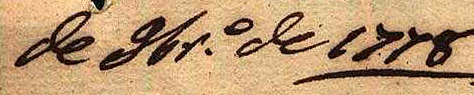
de 9br.o de 1778
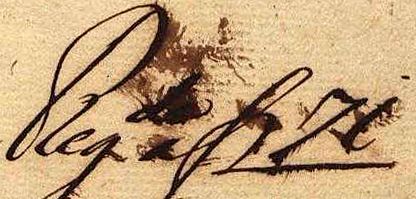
Reg a fl 7i
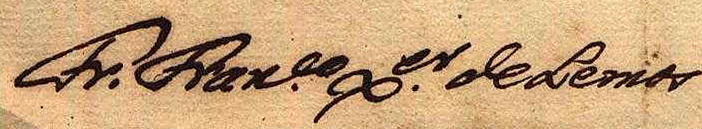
Fr. Fran.co x.er de Lemos
